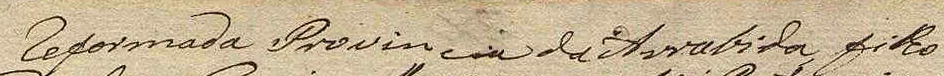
Reformada Provincia da Arrabida, filho
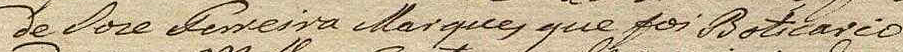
de Ioze Ferreira Marques que foi Boticario
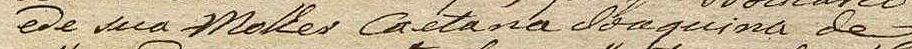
e de sua molher Caetana Ioaquina de
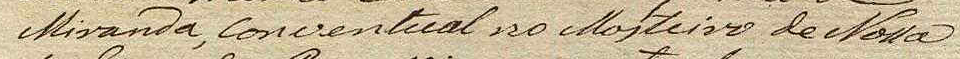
Miranda, conventual no Mosteiro de Nossa
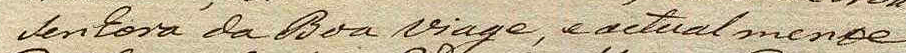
senhora da Boa viage, e actualmente
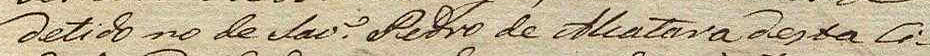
detido no de Saõ Pedro de Alcatara desta Ci
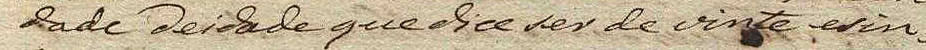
dade de idade que dice ser de vinte e sin
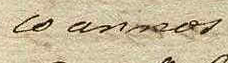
co annos
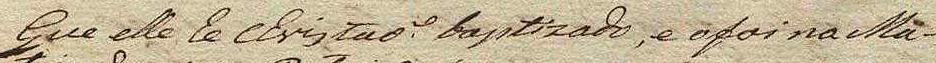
Que elle he christaõ baptizado, e o foi na Ma
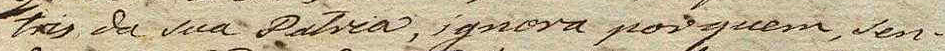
tris da sua Patria, ignora por quem, sen
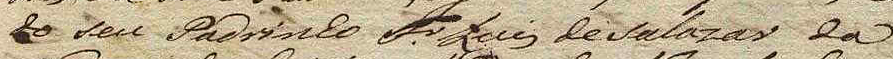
do seu Padrinho F.r Luis de salazar da
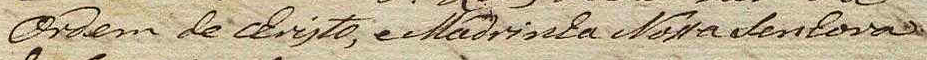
Ordem de christo, e Madrinha Nossa Senhora
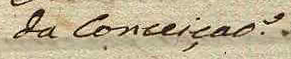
da Conceiçaõ
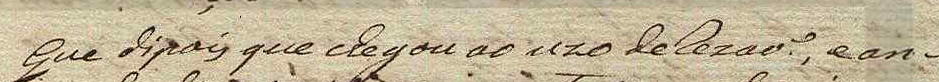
Que dipois que chegou ao uzo de Rezaõ, e an
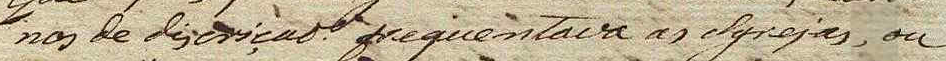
nos de discriçaõ. frequentava as Igrejas, ou
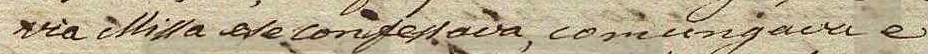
via Missa e se confessava, comungava e
